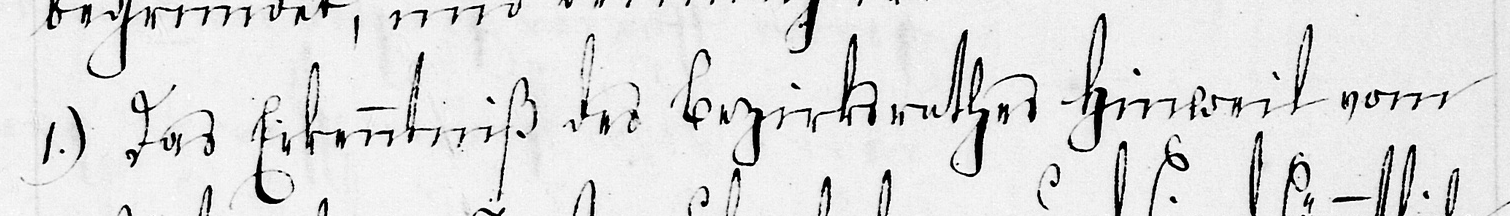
1.) Das Erkenntniß des Bezirksrathes Hinweil vom
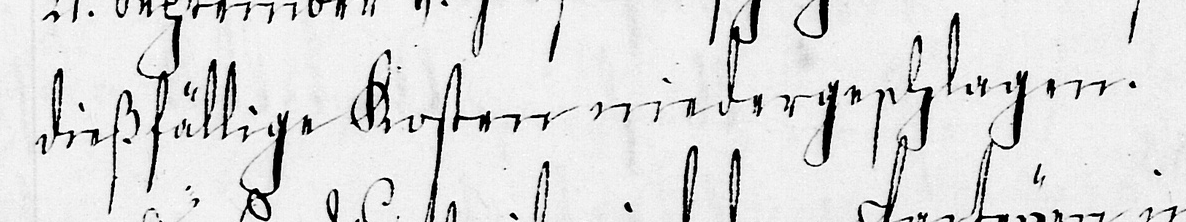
dießfällige Kosten niedergeschlagen.
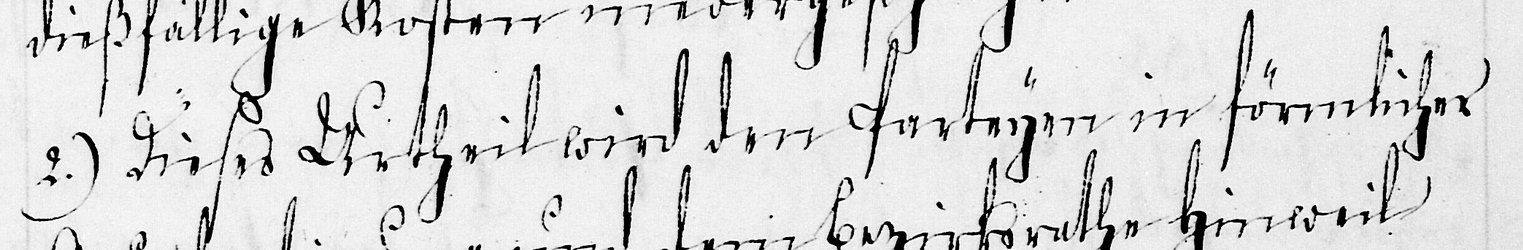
2.) Dieses Urtheil wird den Parteyen in förmlicher
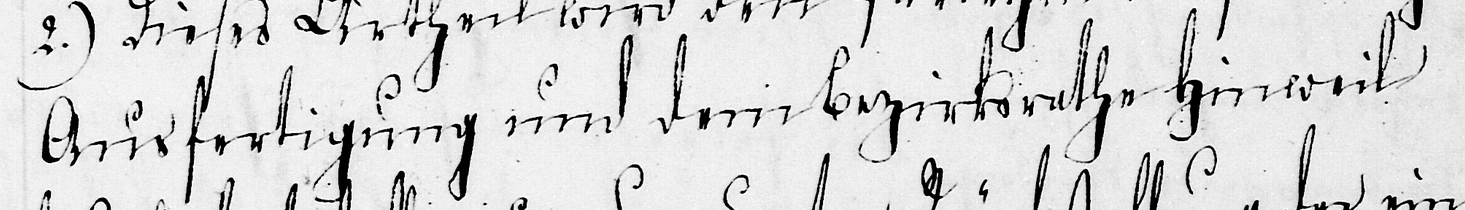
Ausfertigung und dem Bezirksrathe Hinweil
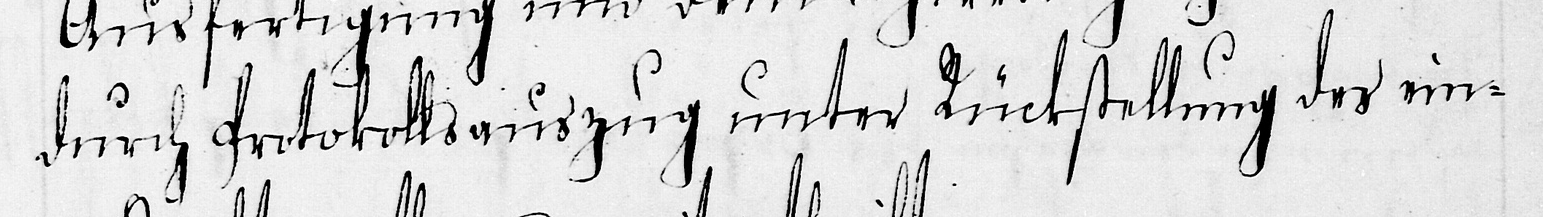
durch Protokollsauszug unter Rückstellung des ein¬
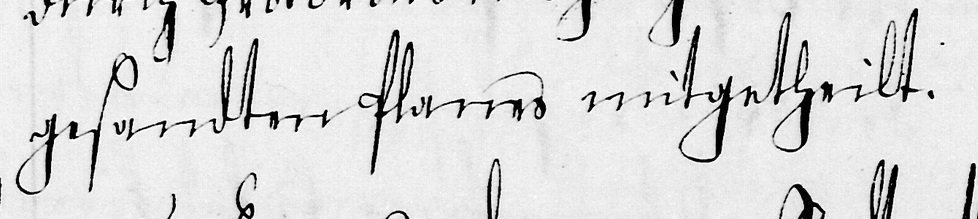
gesandten Planes mitgetheilt.
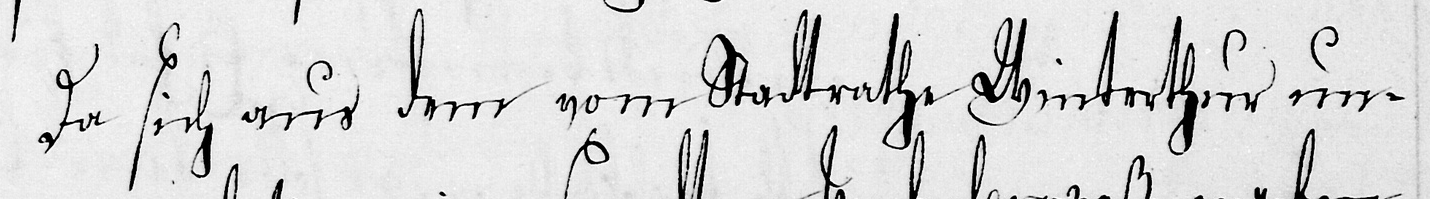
Da sich aus dem vom Stadtrathe Winterthur un¬
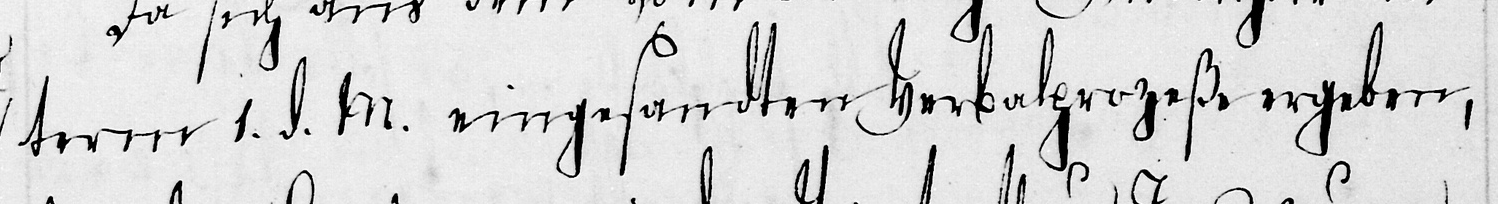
term 1. d. M. eingesandten Verbalprozeße ergeben,
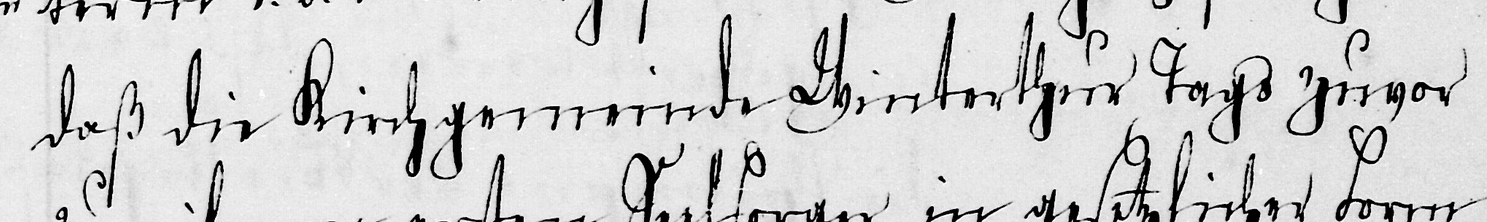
daß die Kirchgemeinde Winterthur Tags zuvor
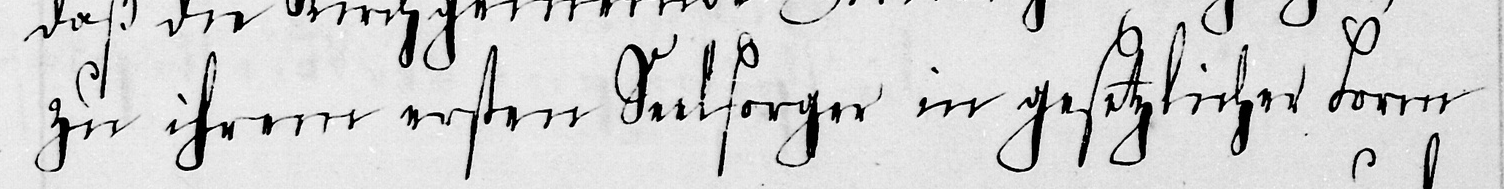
zu ihrem ersten Seelsorger in gesetzlicher Form
